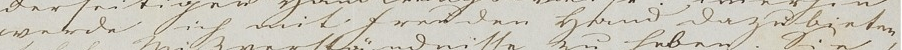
werde ich mit Freuden Hand dazu bieten,
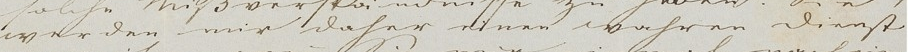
werden mir daher einen wahren Dienst
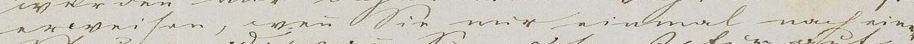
erweisen, wenn Sie mir einmal nach einer
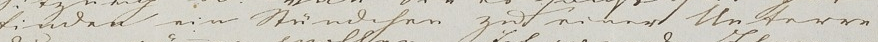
finden ein Stündchen zu einer Unterre-
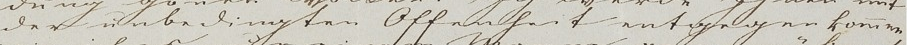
der unbedingten Offenheit entgegnen können,
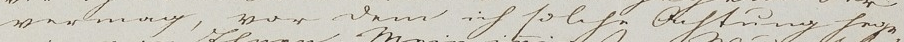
vermag, vor dem ich solche Achtung hege,
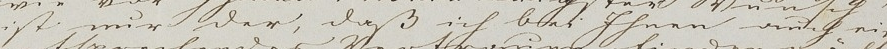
ist nur der, daß ich bei Ihnen auch ein
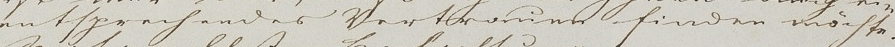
entsprechendes Vertrauen finden möchte.
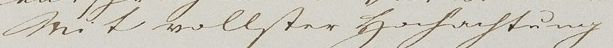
Mit vollster Hochachtung
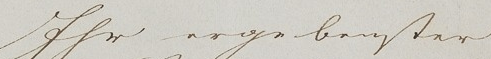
Ihr ergebenster
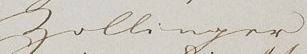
H Zollinger
